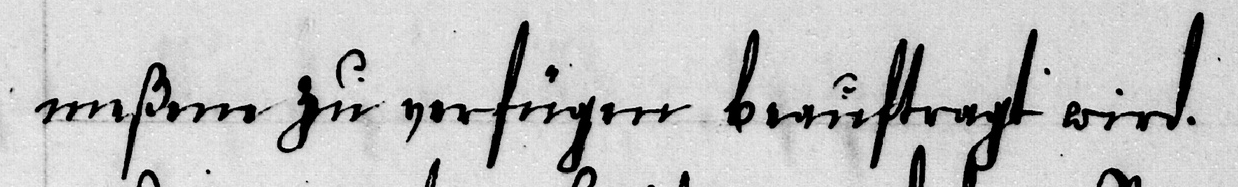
meßene zu verfügen beauftragt wird.
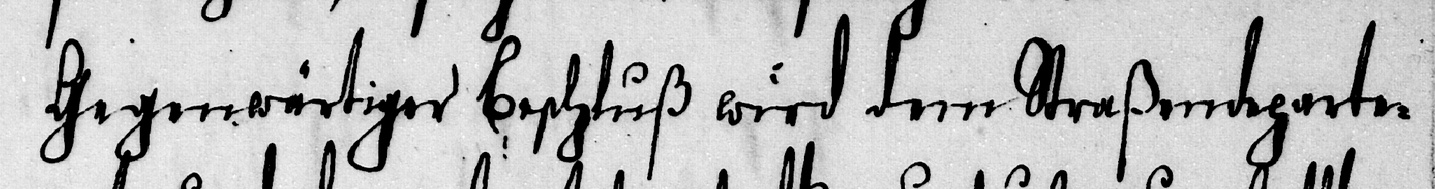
Gegenwärtiger Beschluß wird dem Straßendeparte¬
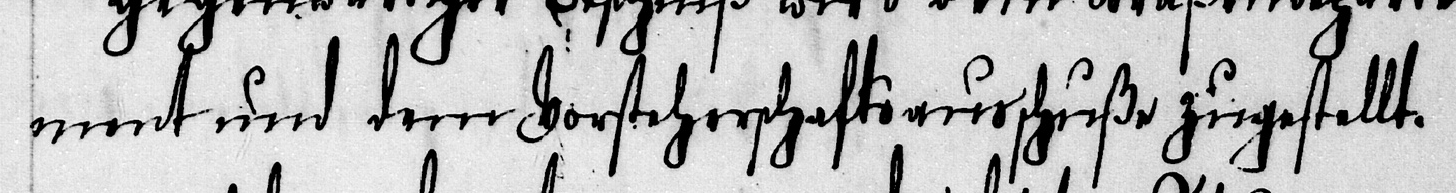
ment und dem Vorsteherschaftsausschuße zugestellt.
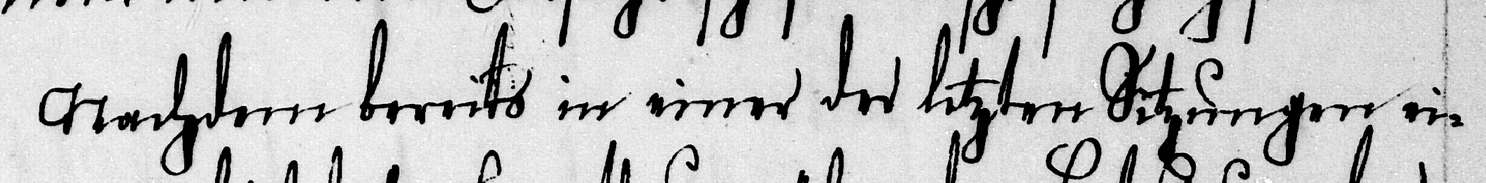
Nachdem bereits in einer der letzten Sitzungen ei¬
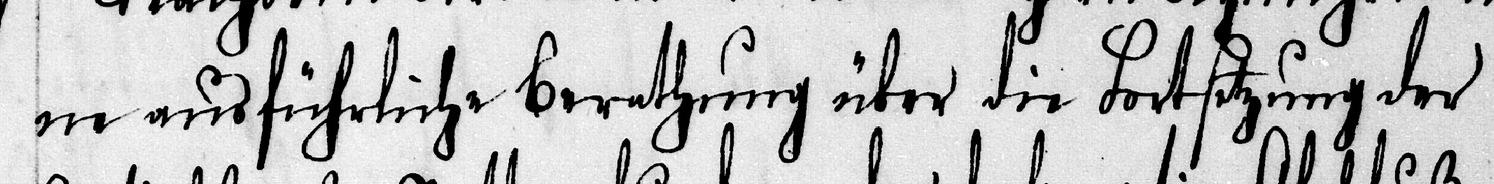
ne ausführliche Berathung über die Fortsetzung der
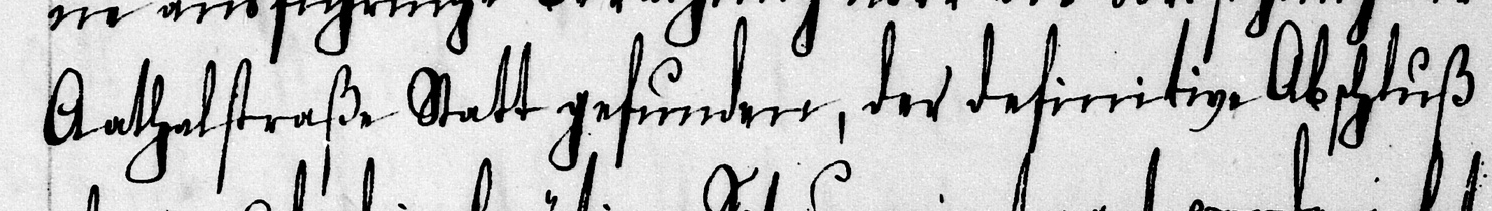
Aathalstraße Statt gefunden, der definitive Abschluß
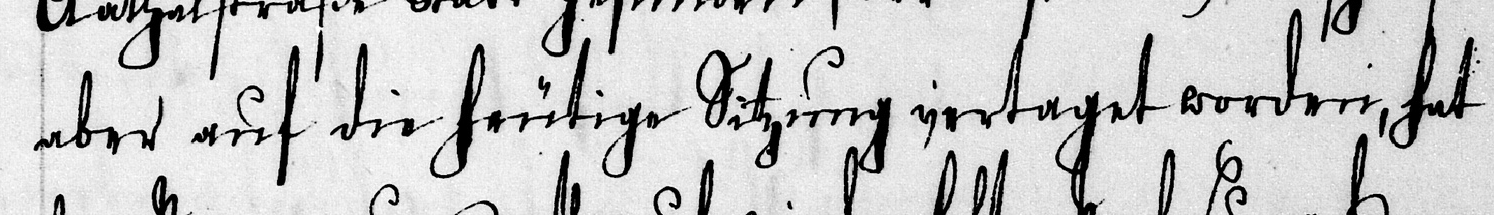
aber auf die heutige Sitzung vertaget worden, hat
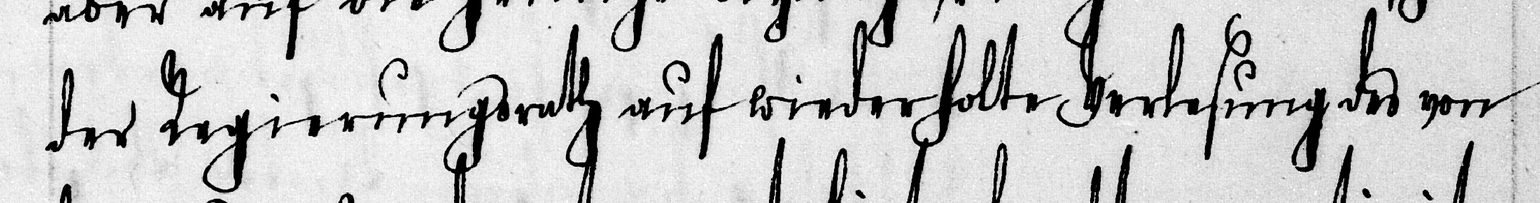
der Regierungsrath auf wiederholte Verlesung des von
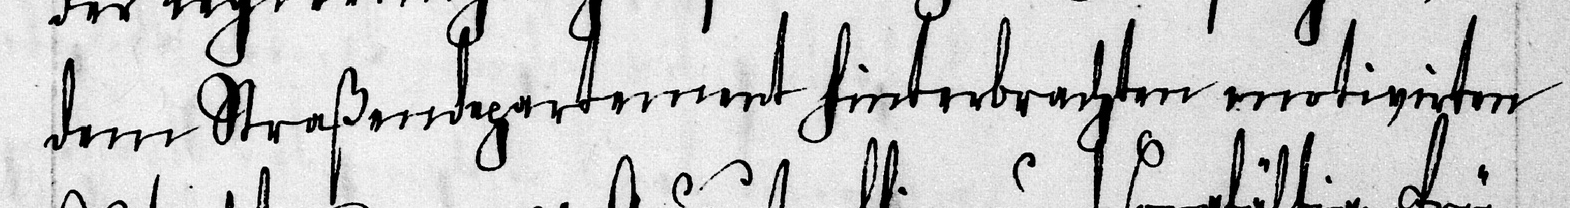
dem Straßendepartement hinterbrachten motivirten
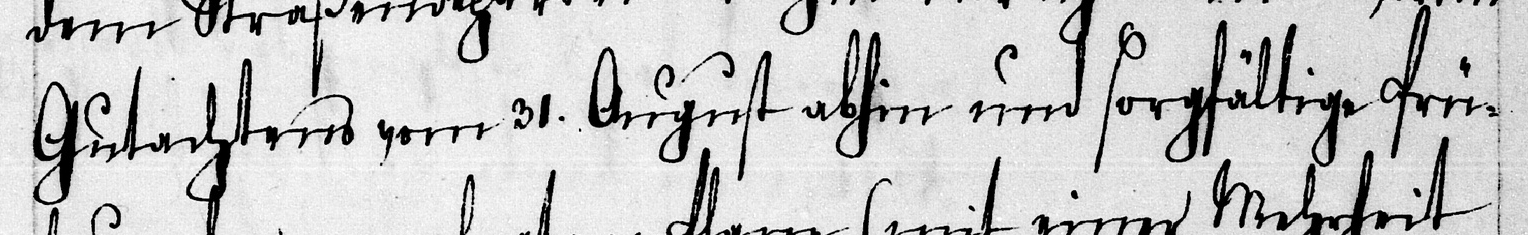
Gutachtens vom 31. August abhin und sorgfältige Prü¬
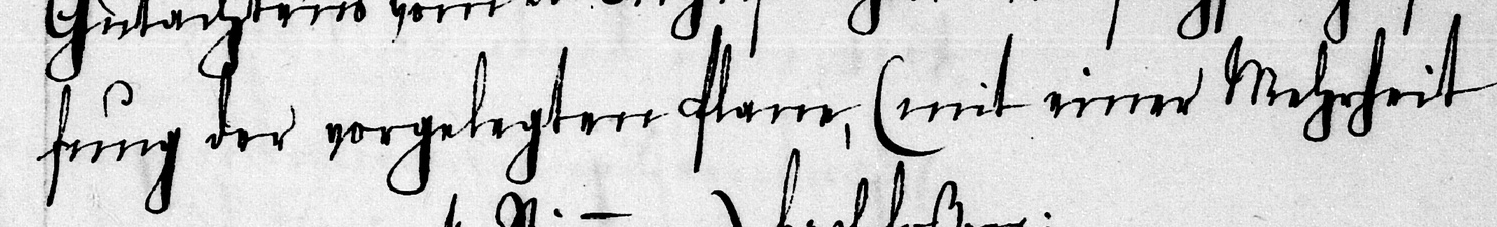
fung der vorgelegten Plane, (mit einer Mehrheit
